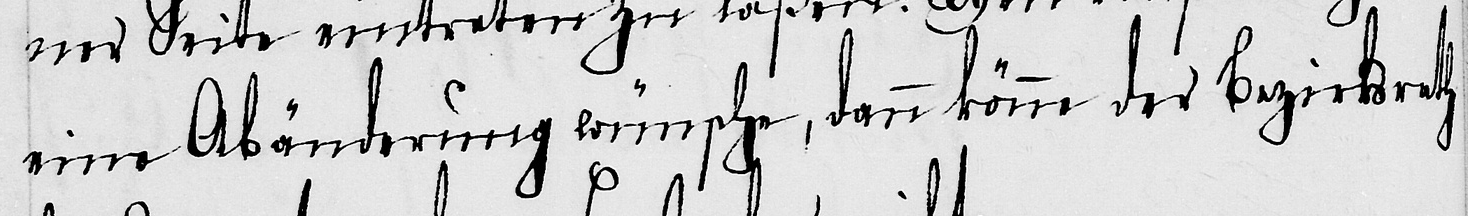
eine Abänderung wünsche, dann könne er Bezirksra¬
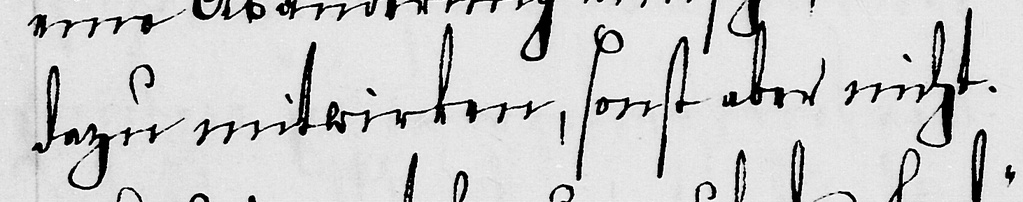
dazu mitwirken, sonst aber nicht.
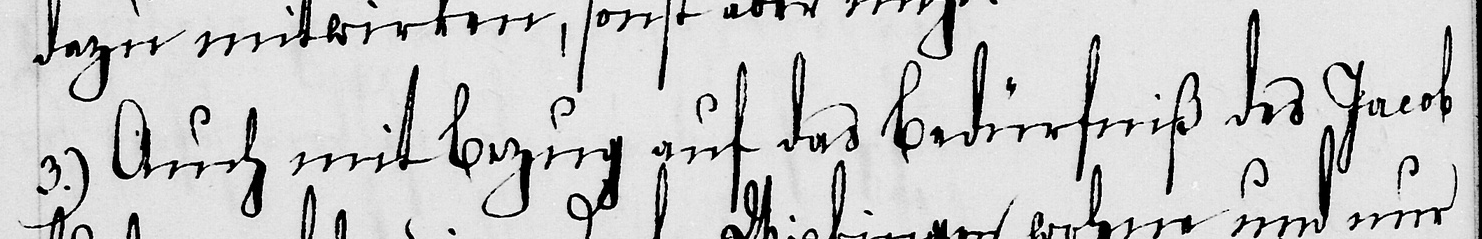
3.) Auch mit Bezug auf das Bedürfniß des Jacob
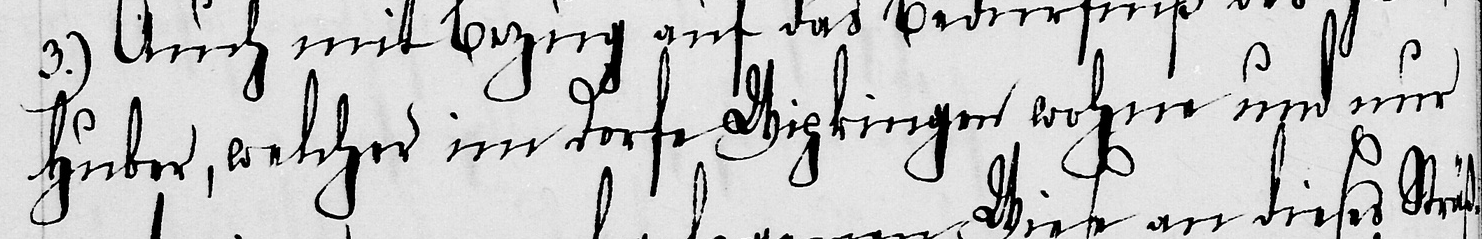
Huber, welcher im Dorfe Wipkingen wohne und nur
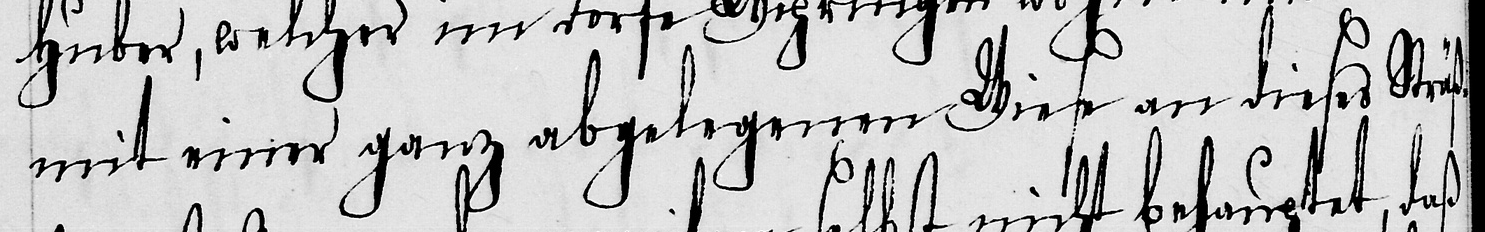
mit einer ganz abgelegenen Wiese an dieses Strä¬
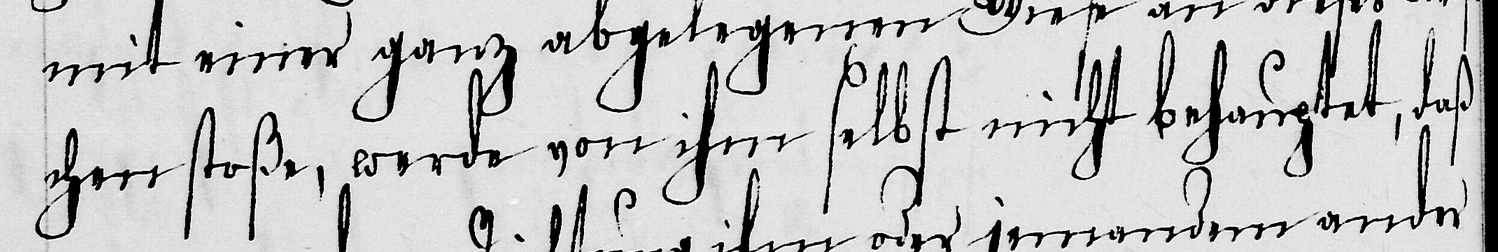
ßchen stoße, werde von ihm selbst nicht behauptet, daß
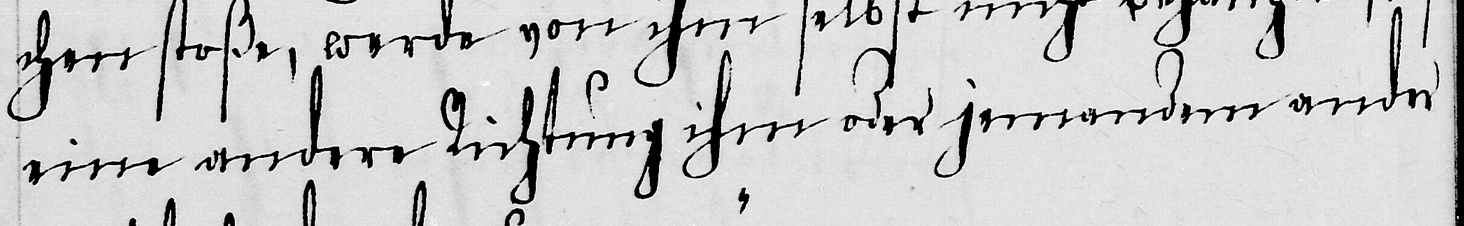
eine andere Richtung ihm oder jemandem ander
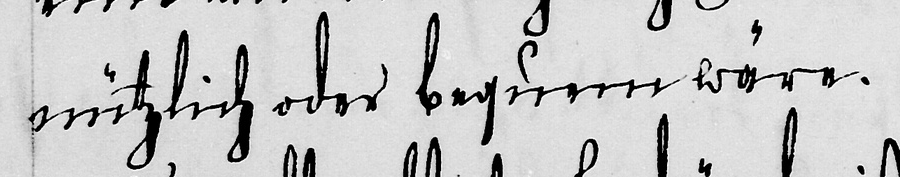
nützlich oder bequem wäre.
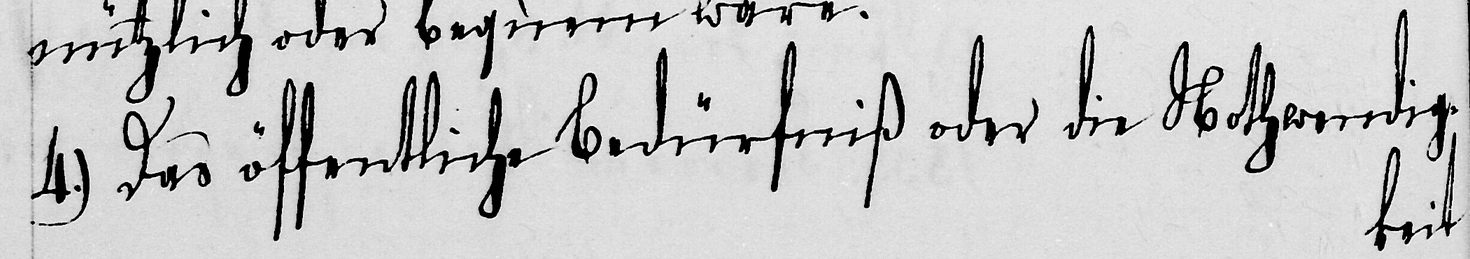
4.) Das öffentliche Bedürfniß oder die Nothwendig-
